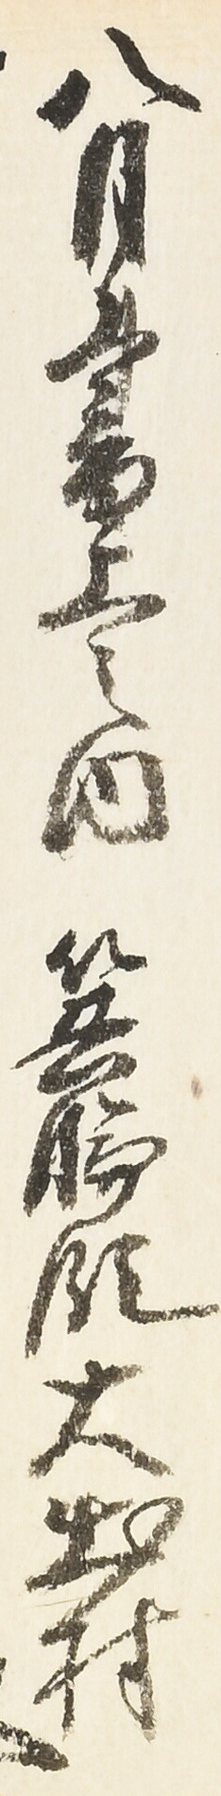八月書上之内箕輪領大出村
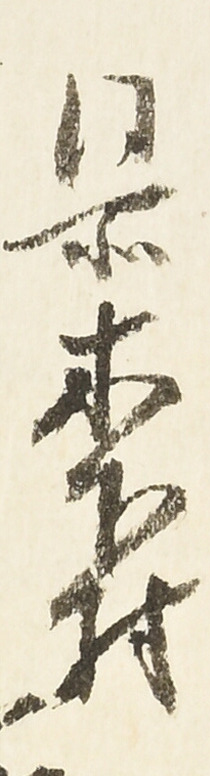同然木下村
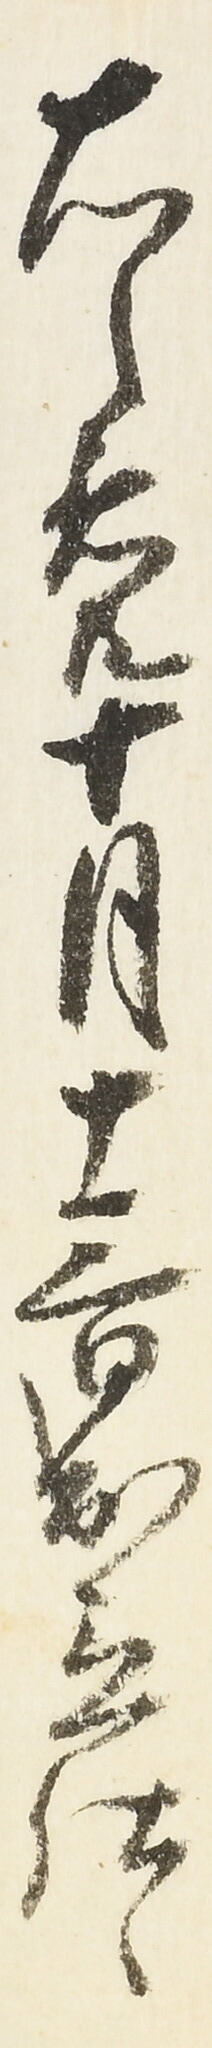右之者共十月十三日出立仕候
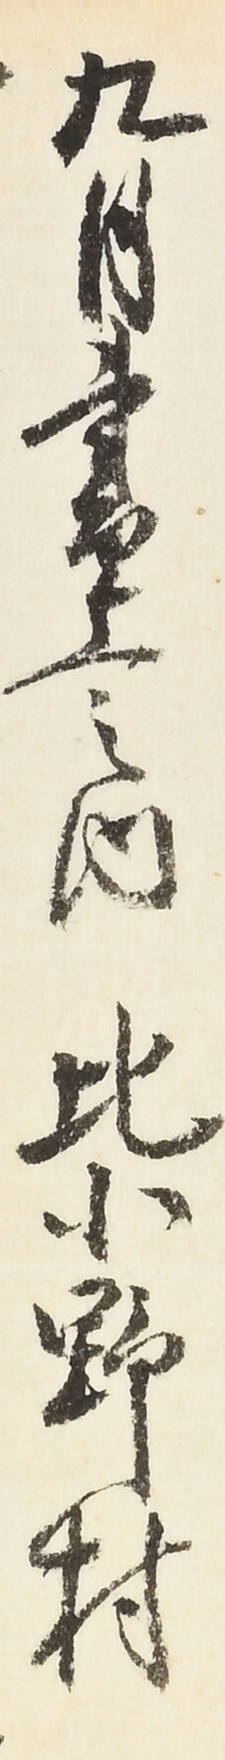九月書上之内比小野村
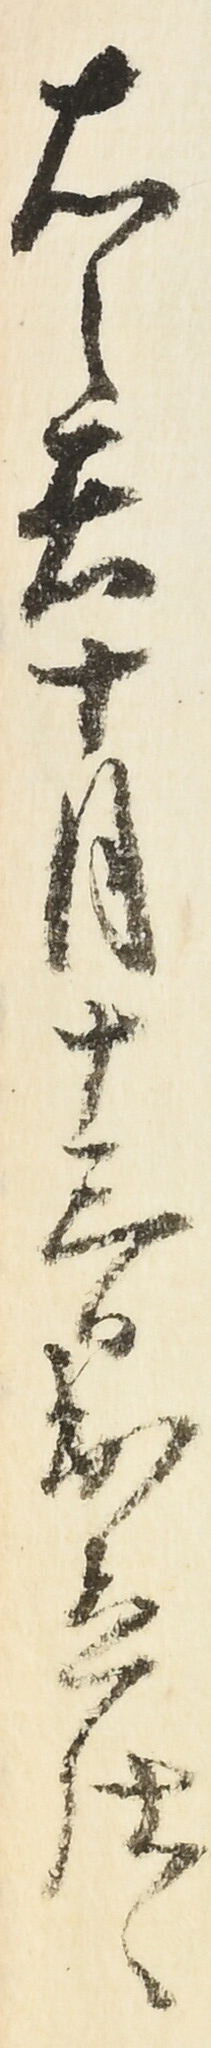右之者十月十三日出立仕候

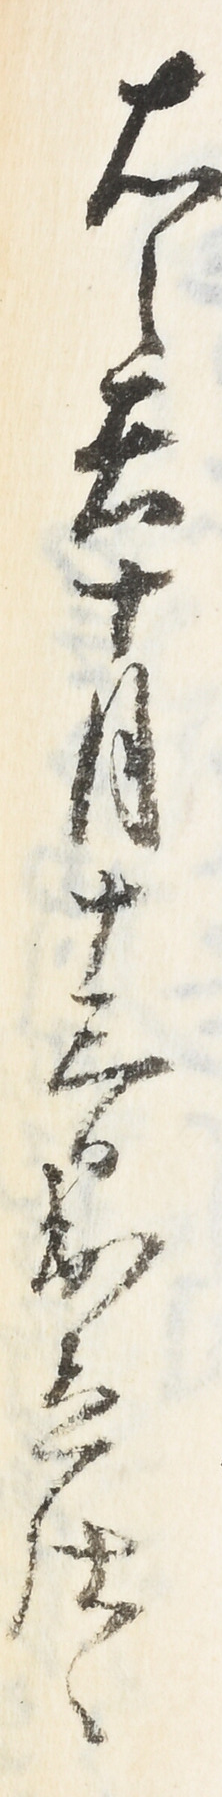右之者同廿九日出立仕候
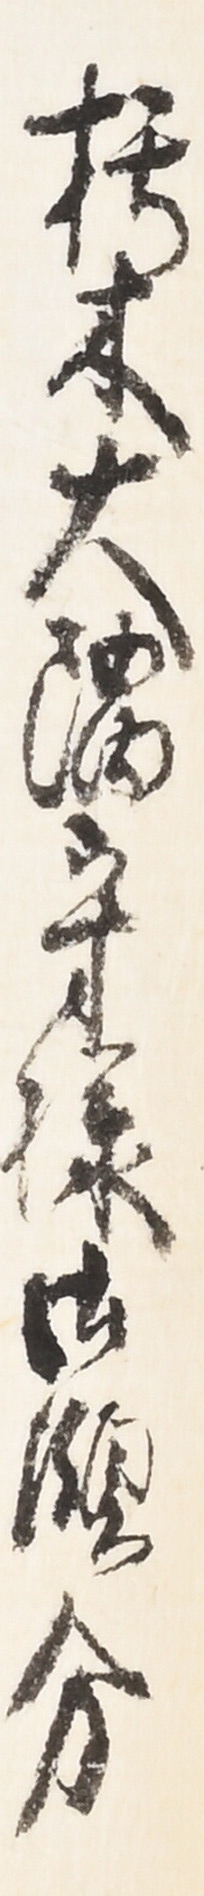朽木大隅守様御領分
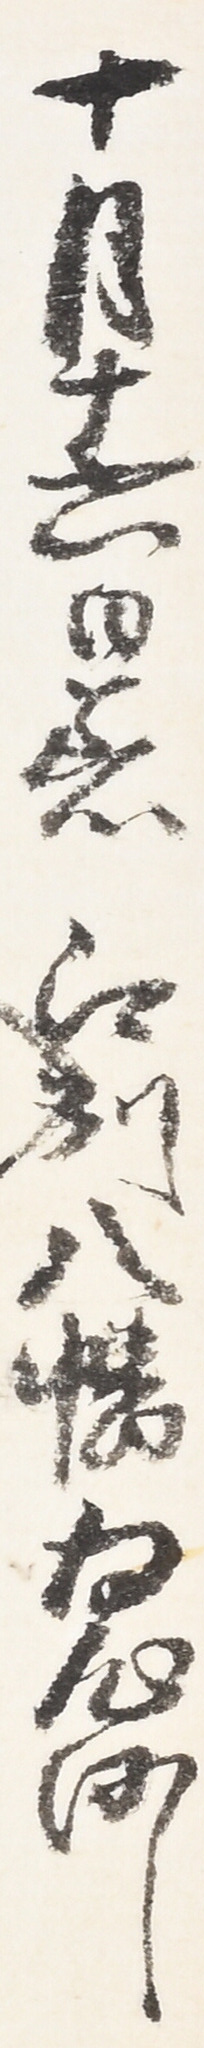十月十六日着江州八幡為心町
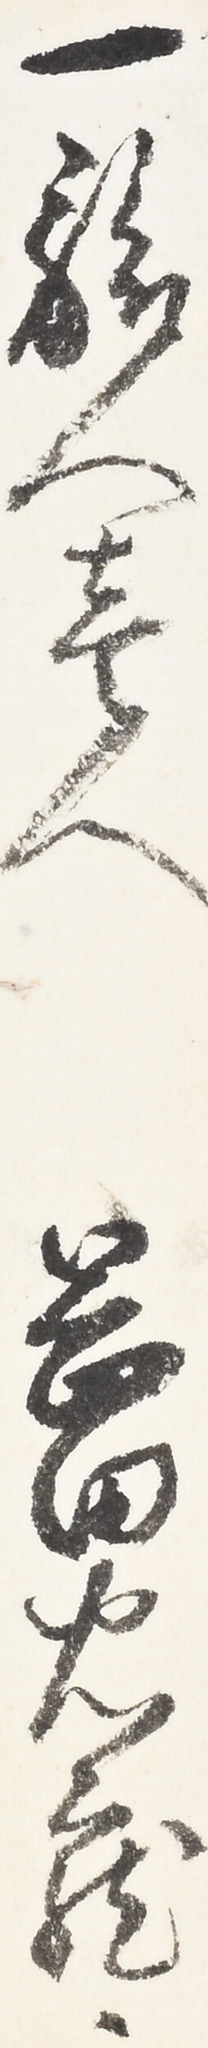一旅人壱人岡田忠蔵・
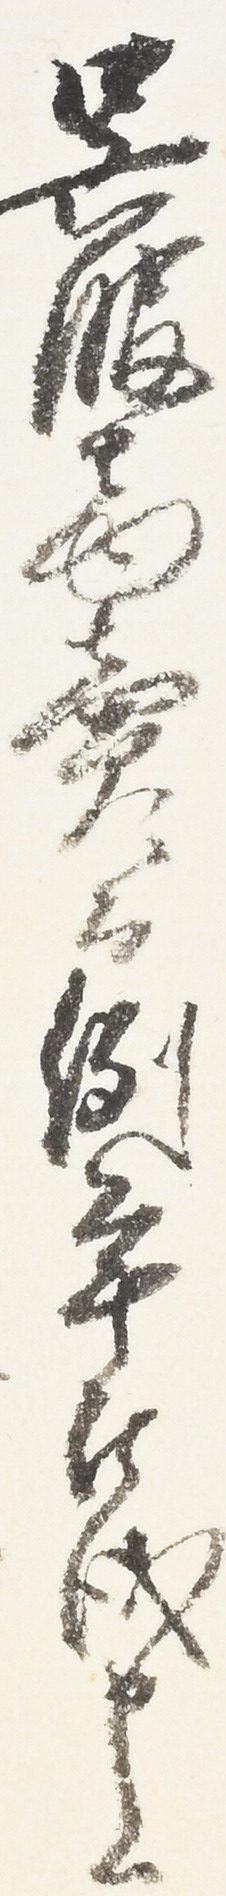呉服商売ニ而例年罷越申候
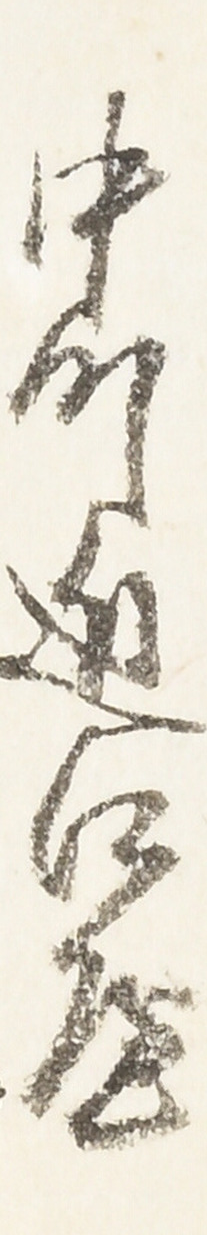中町近江屋
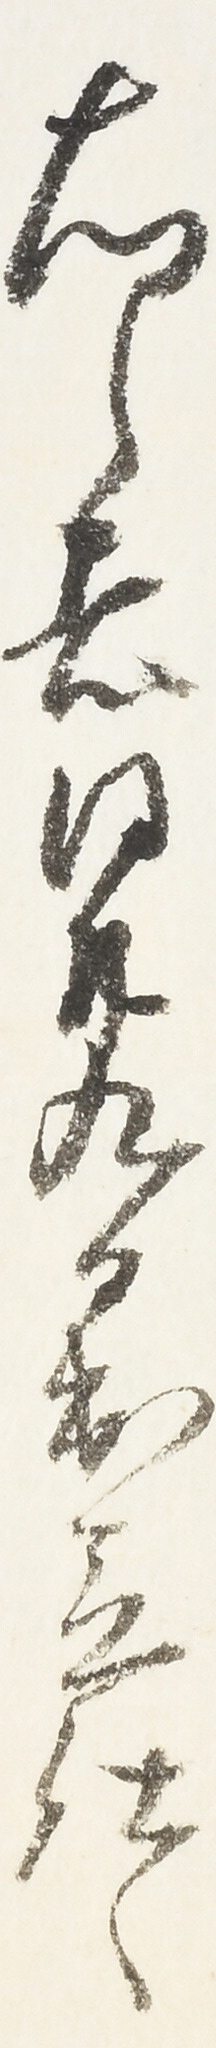右之者同廿九日出立仕候
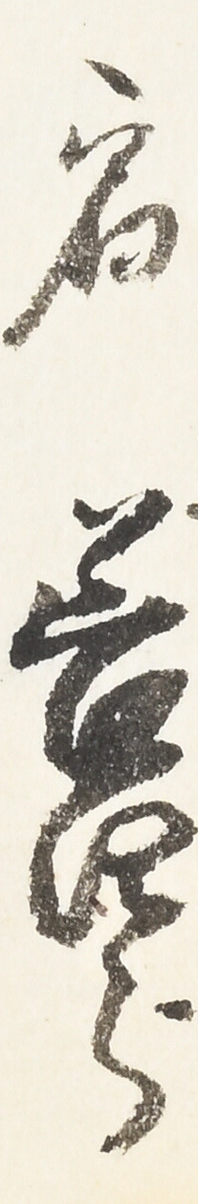宿善四郎
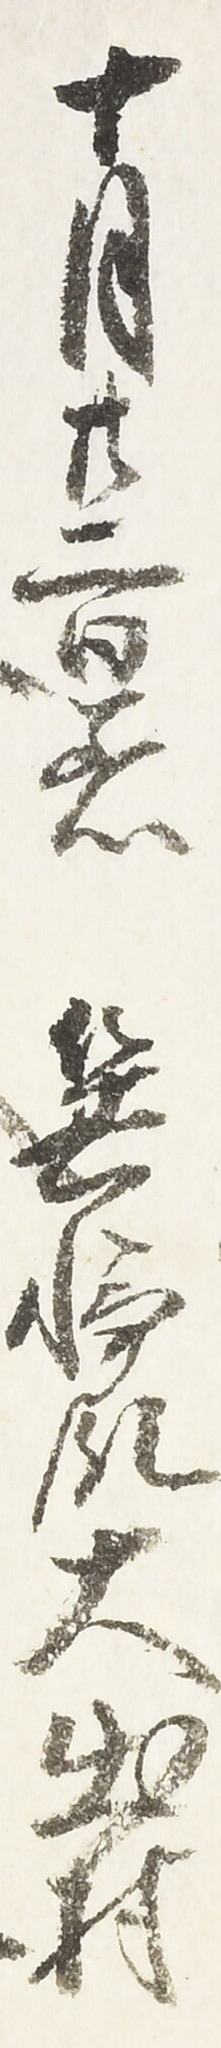十月廿二日着箕輪領大出村
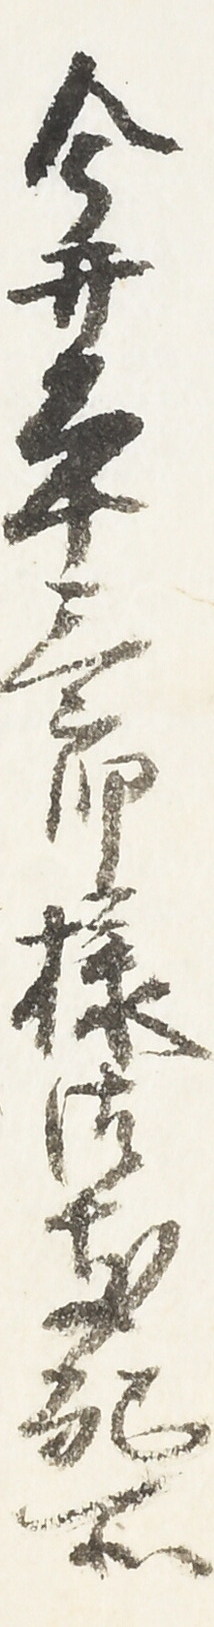今井平三郎様御支配所
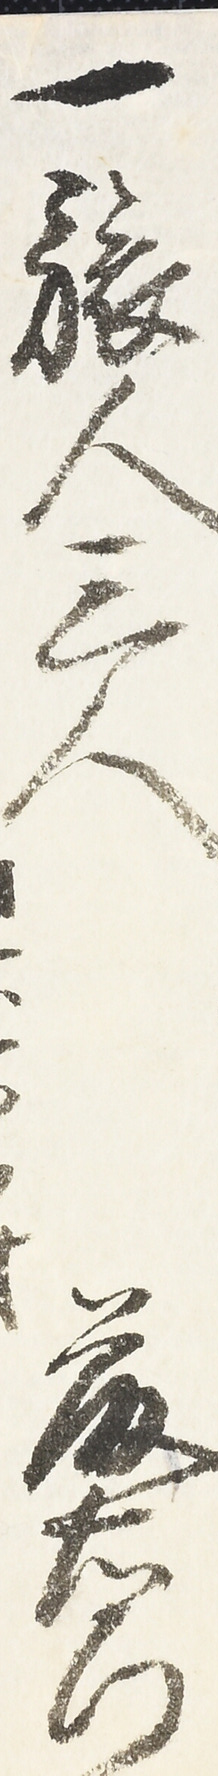一旅人三人籐右衛門・
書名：町中旅人泊控帳
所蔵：伊那市立高遠町図書館・合同会社AMANE
